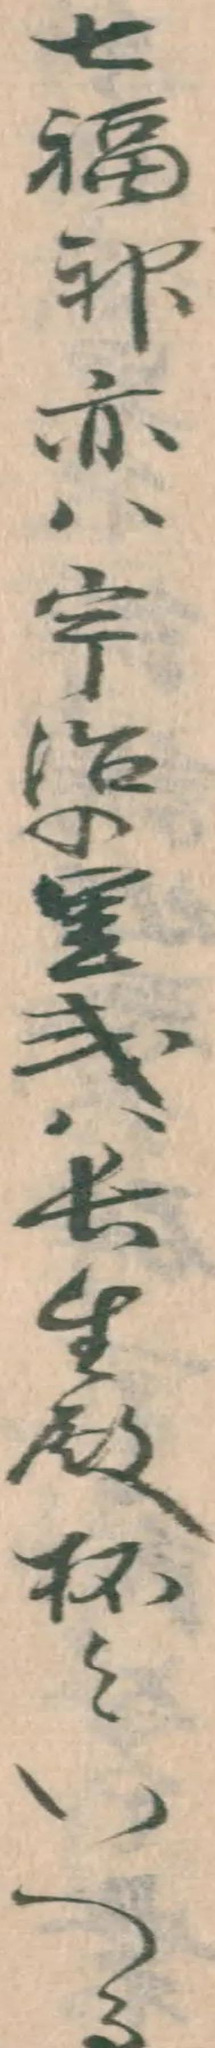七福神亦ハ宇治の里或ハ長生殿抔といへる
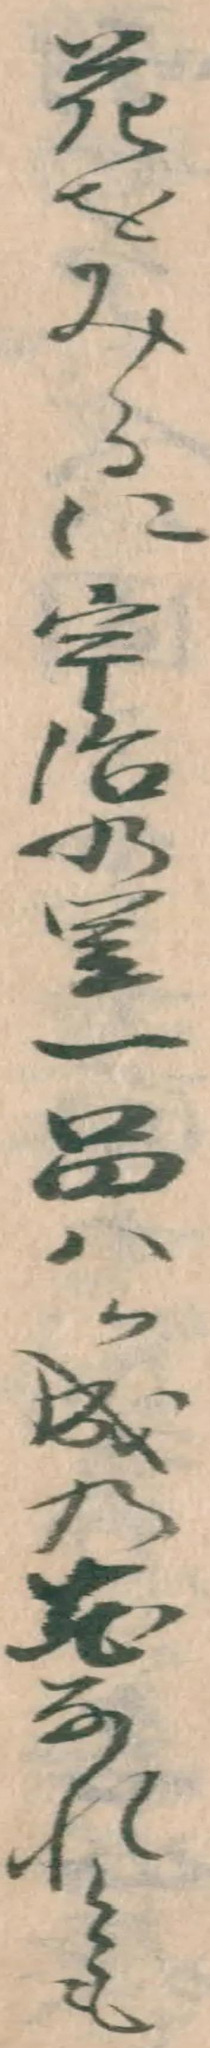花をみるに宇治の里一品ハッ成の花なれとも
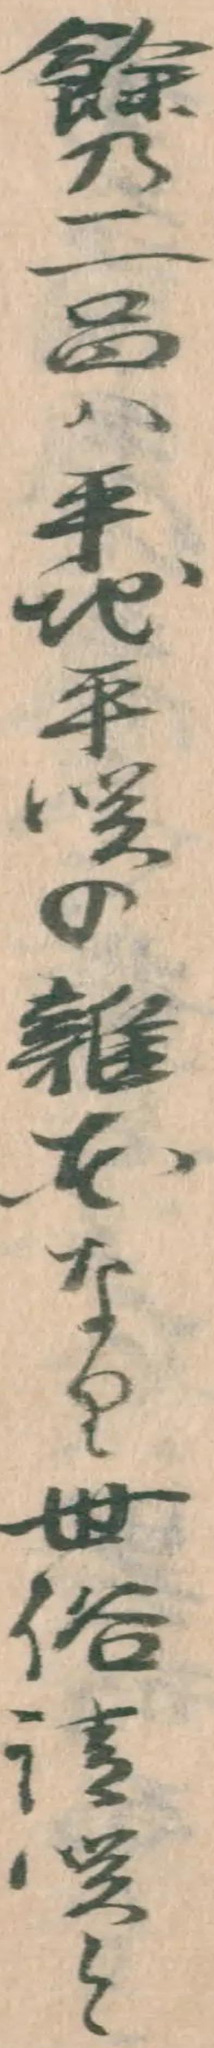予のニ品ハ平地平咲の雑花なり世俗請咲と
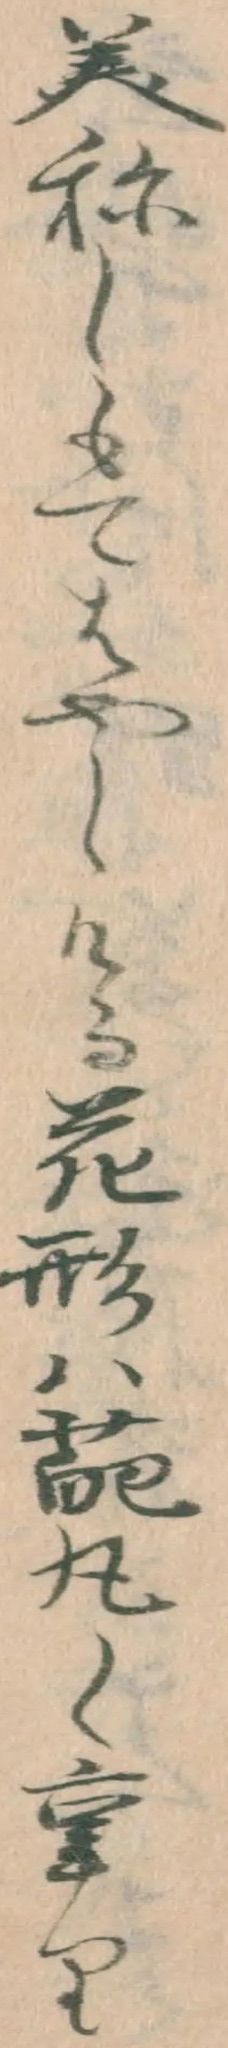美称しもてはやしける花形ハ葩丸く重り

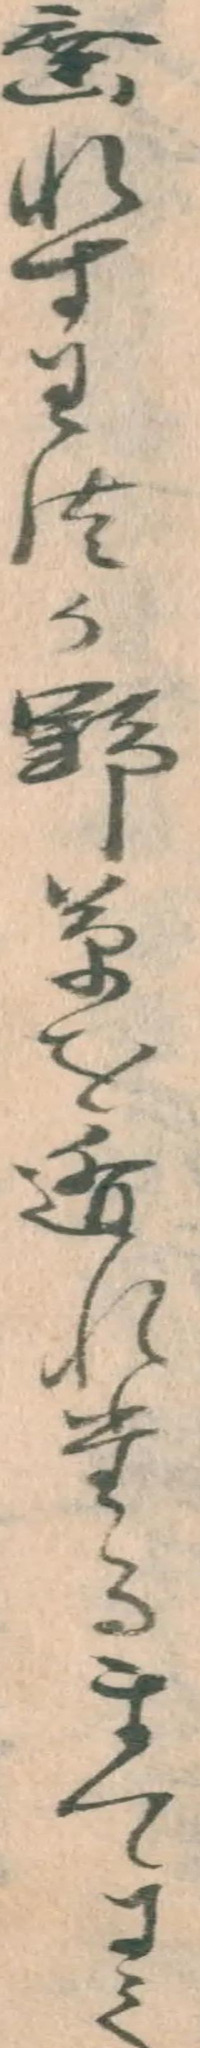垂れすわつか野草を遁れたるまてにて
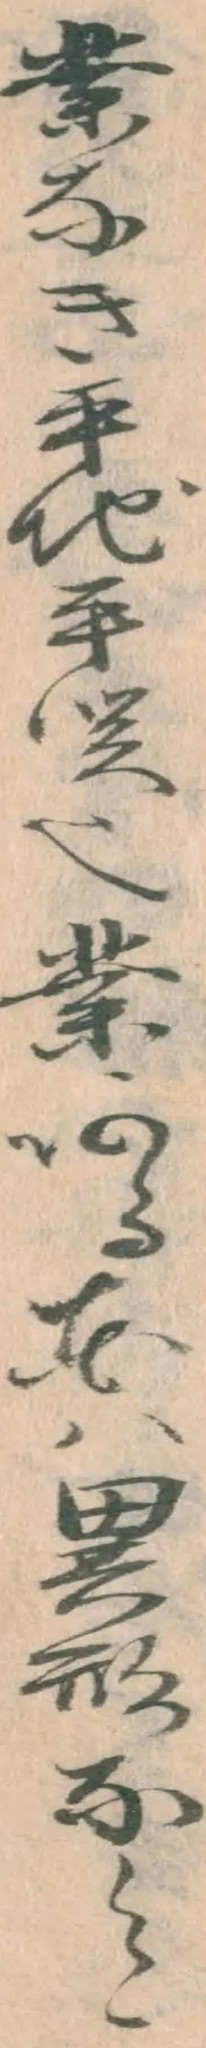業なき平地平咲也業ある花ハ異形なくと
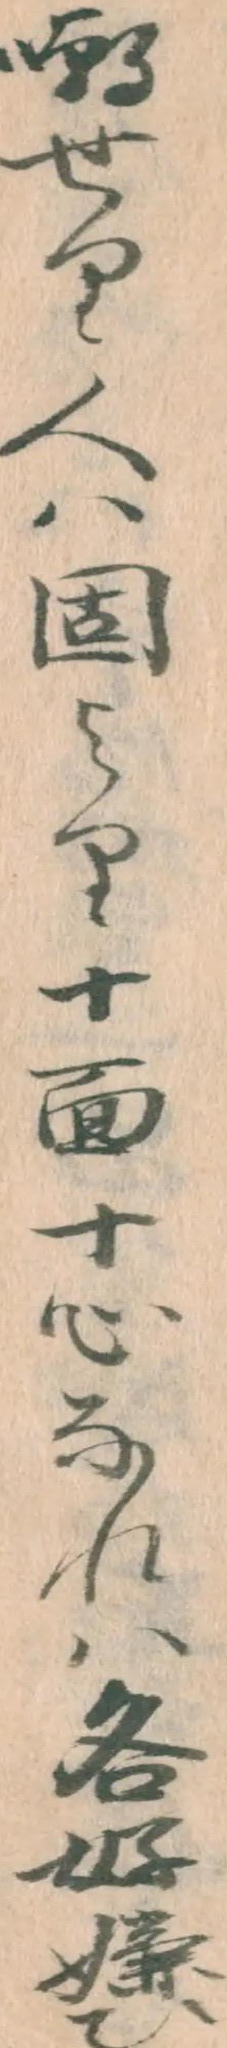嘲せり人ハ固はり十面十心なれハ各好嫌ひ
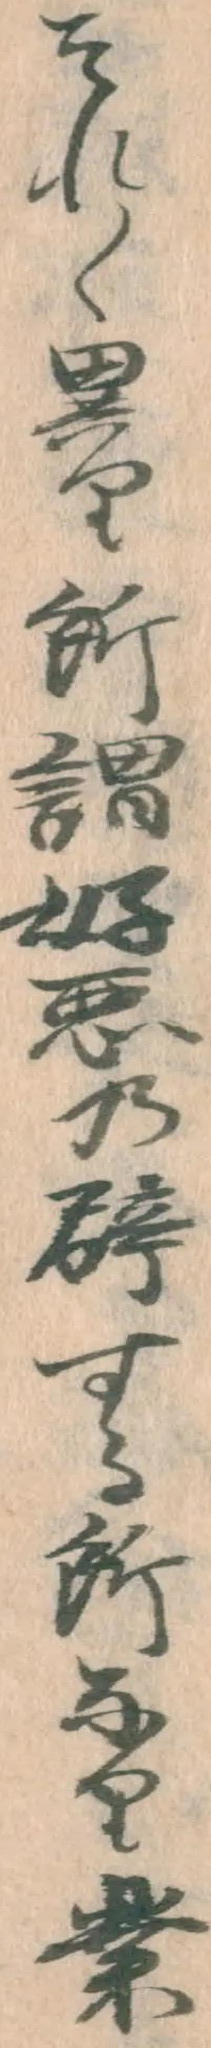それ〳〵異り所謂好悪の辟する所なり業
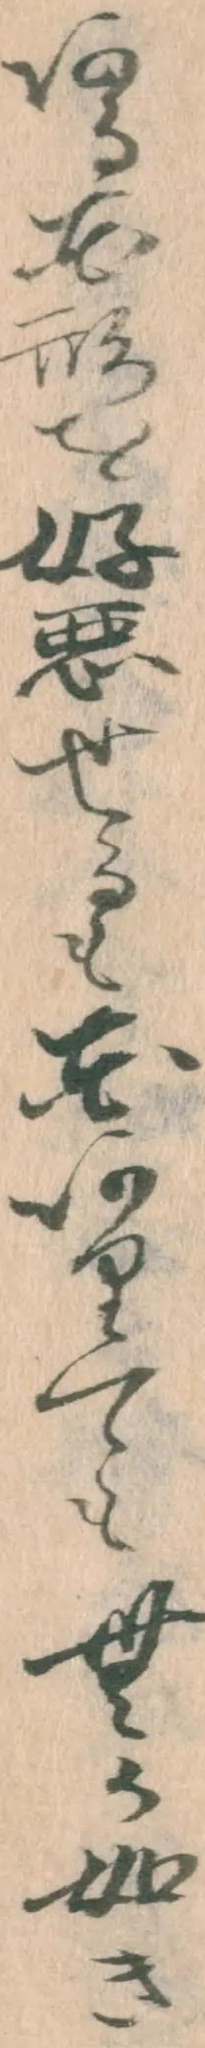ある花形を好悪せるも花ありても無か如き
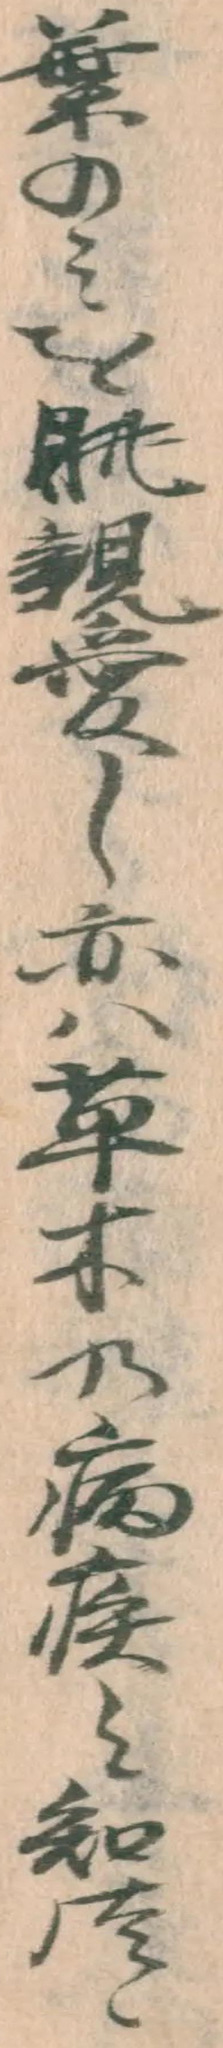業のミを眺親愛し亦ハ草木の病疾と知つゝ
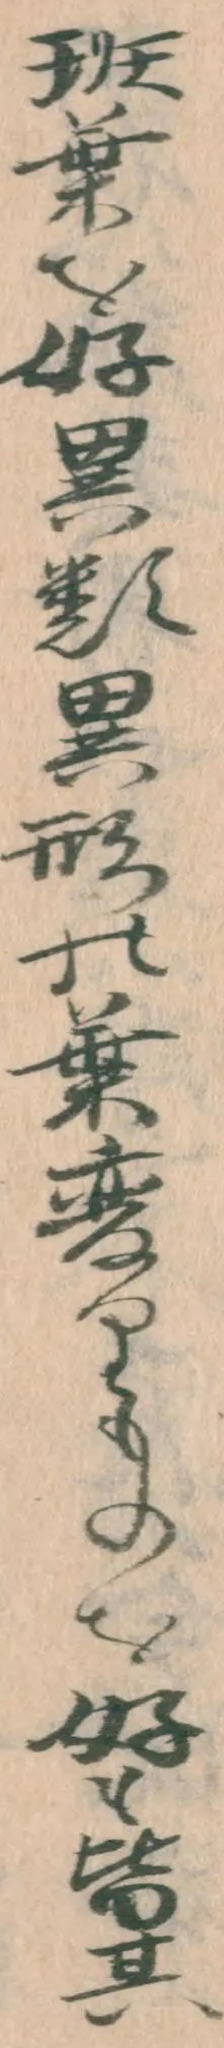斑葉を好異類異形の葉変りものを好も皆其
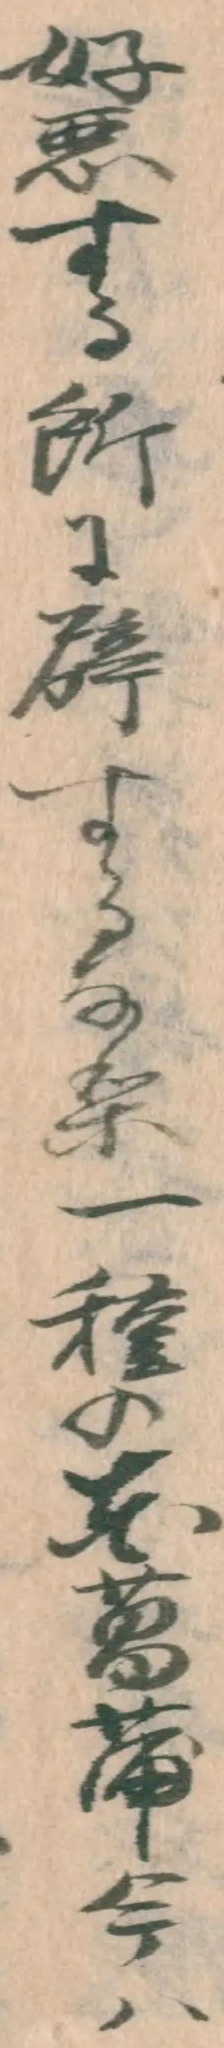好悪する所に辟するなり一種の花菖蒲今ハ
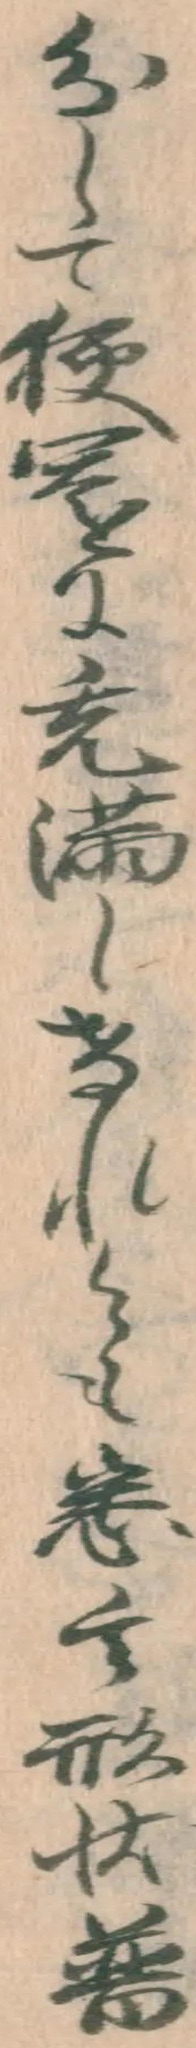分して狭岡に充満しけれとも悉言形状普
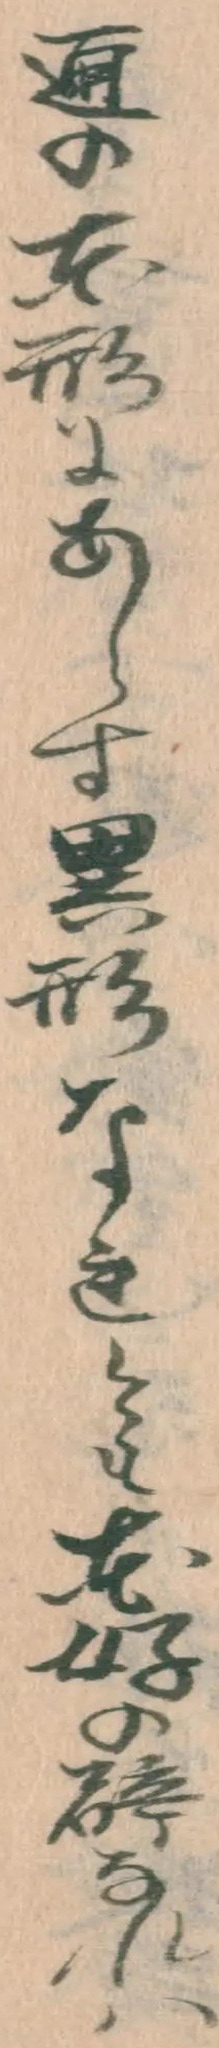通の花形にあらす異形なれとも花好の辟なれハ
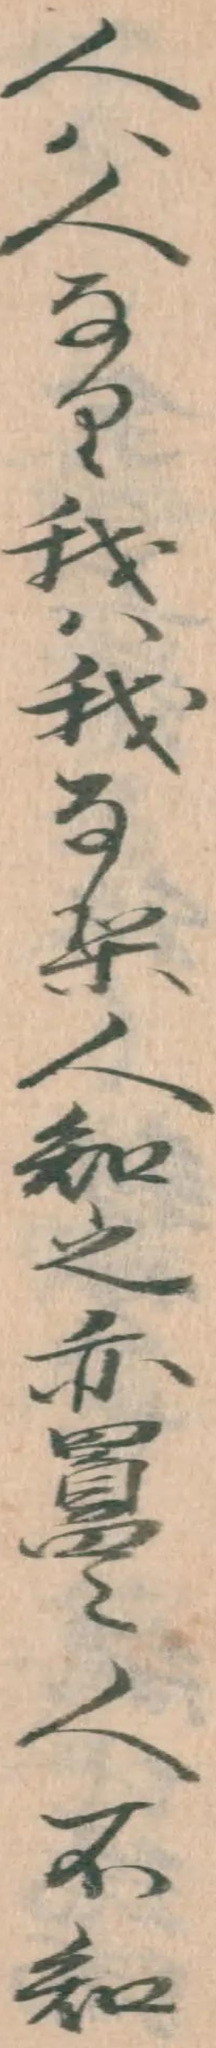人ハ人なり我ハ我なり人知之亦々人不知
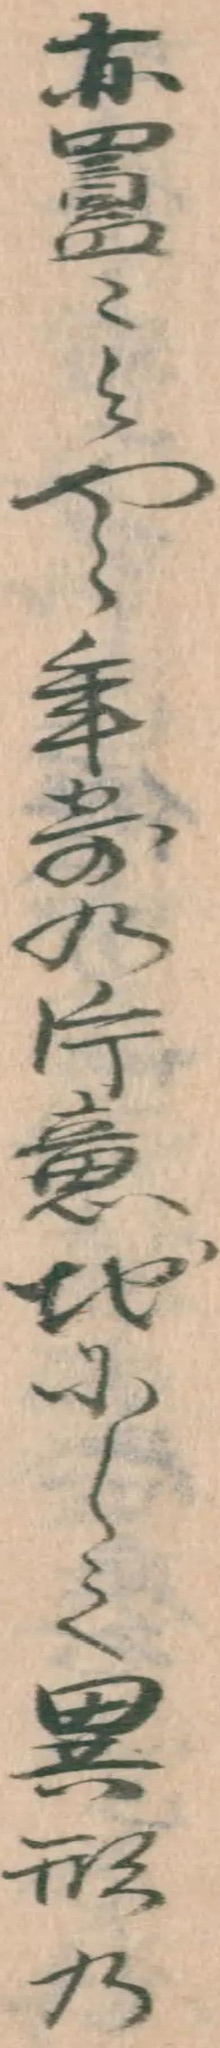亦々とやゝ年寄の片想地にして異形の
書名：花菖培養録
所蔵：国立国会図書館 National Diet Library, JAPAN
